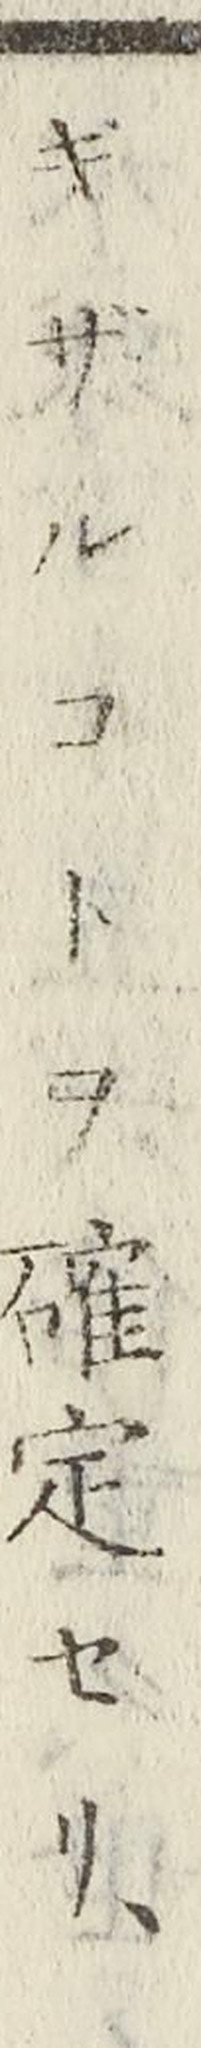ギザルコトヲ確定セリ、
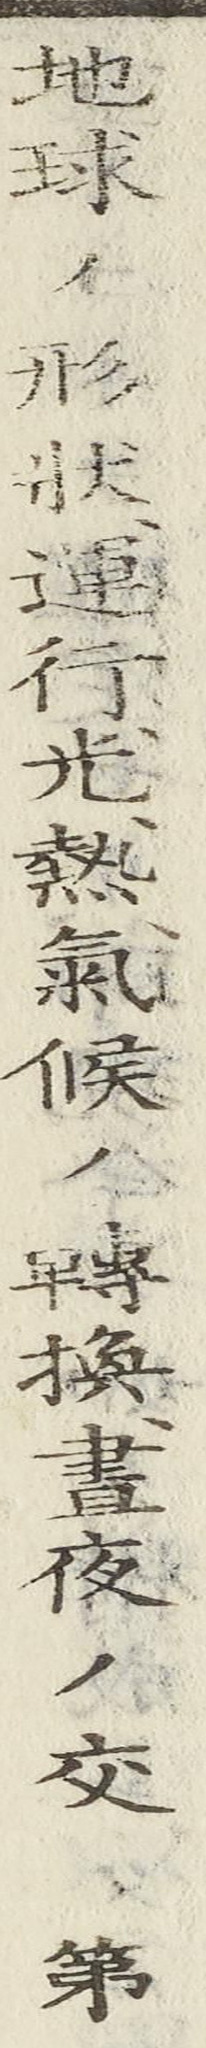地球ノ形状、運行、光熱、気候ノ転換、昼夜ノ交
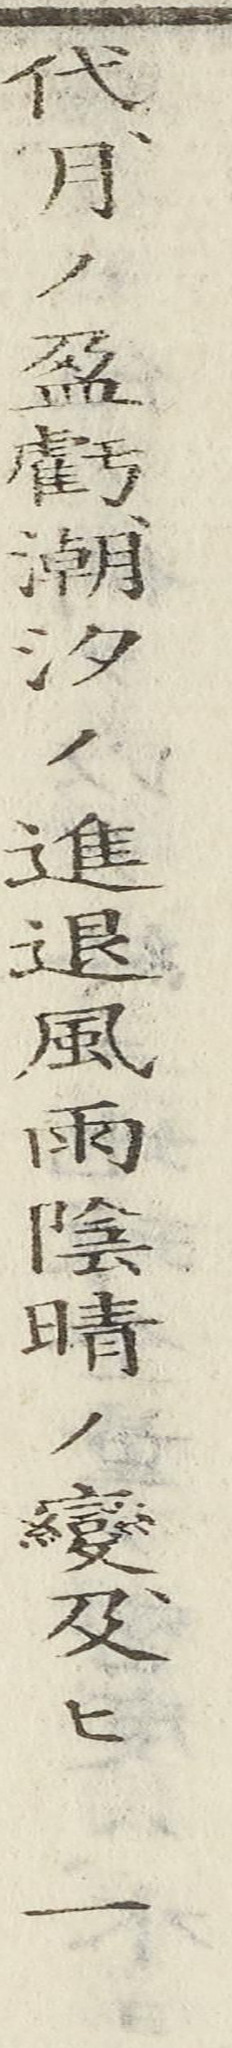代、月ノ盈虧、潮汐ノ進退風雨陰晴ノ変、及ヒ
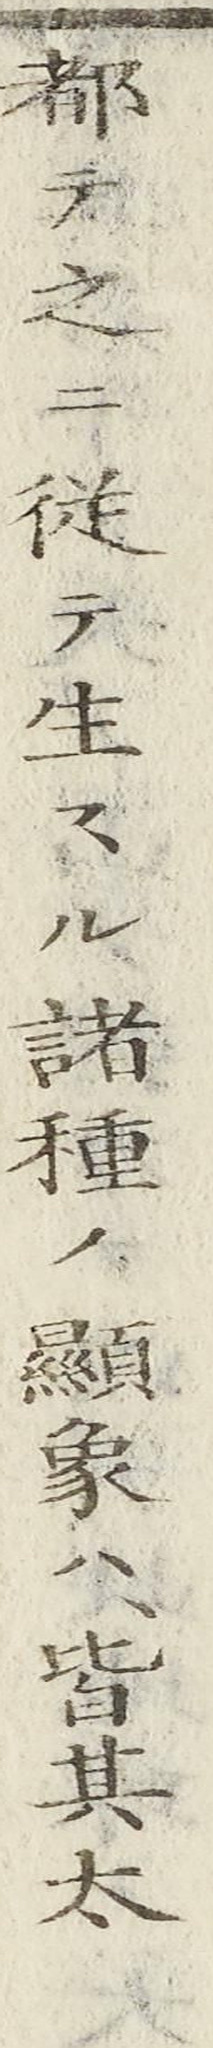都テ之ニ従テ生スル諸種ノ顕象ハ、皆其太
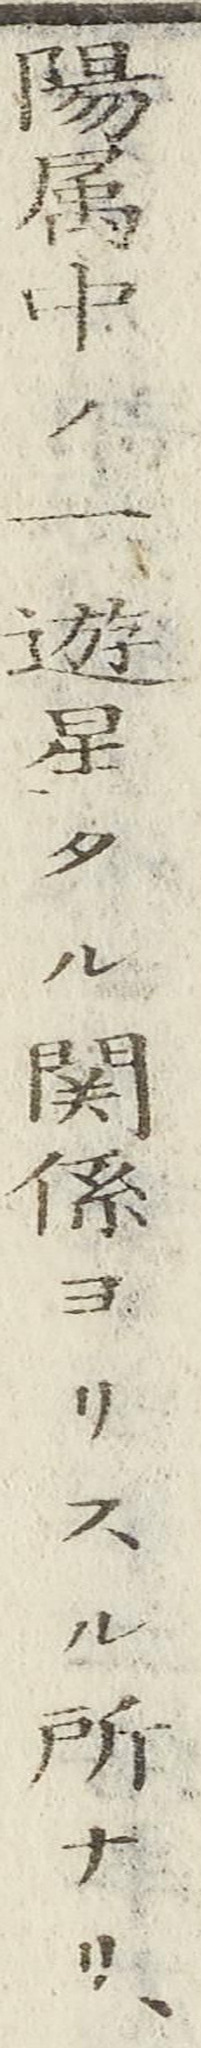陽属中ノ一遊星タル関係ヨリスル所ナリ、
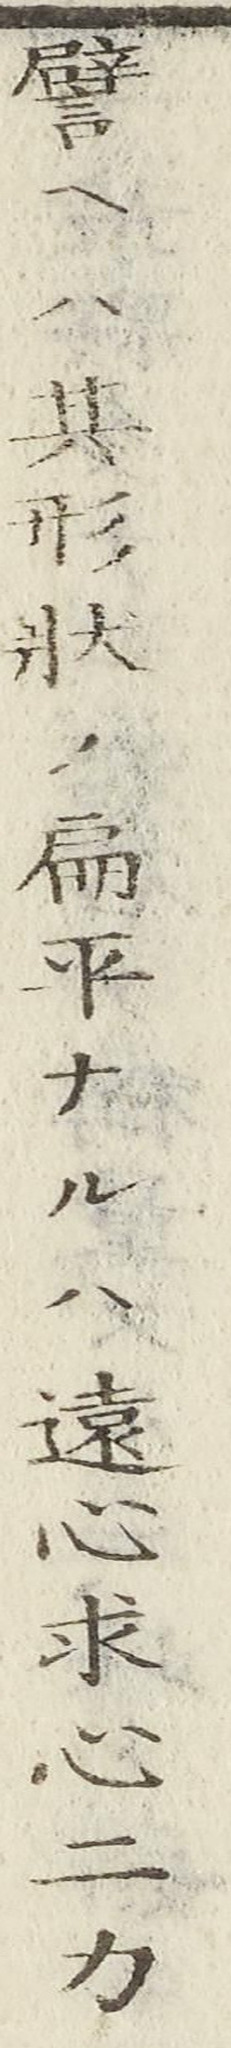例ヘハ其形状ノ扁平ナルハ遠心求心ニ力
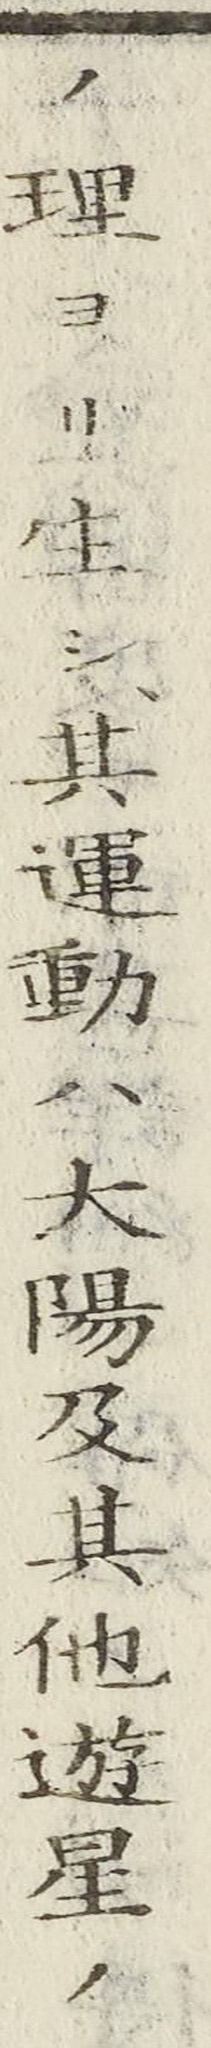ノ理ヨリ生シ、其運動ハ大陽及其他遊星ノ
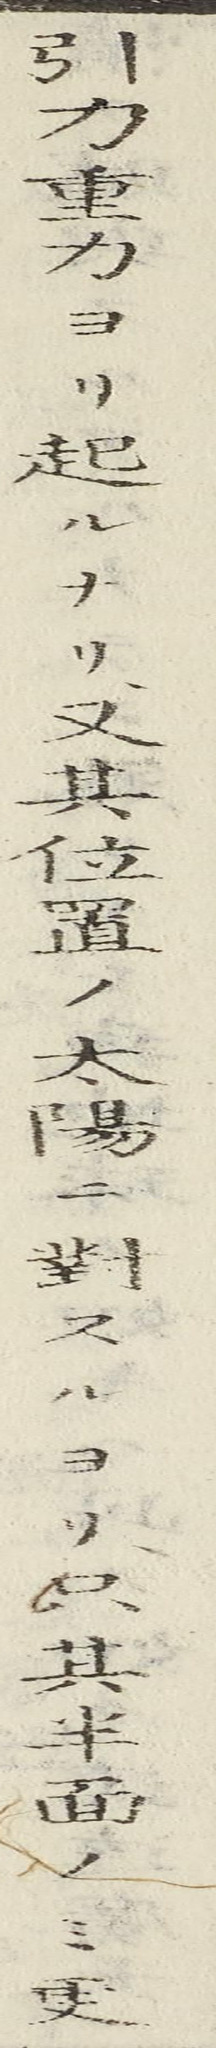引力重力ヨリ起ルナリ、又其位置ノ太陽ニ対スルヨリ、只其半面ノミ更
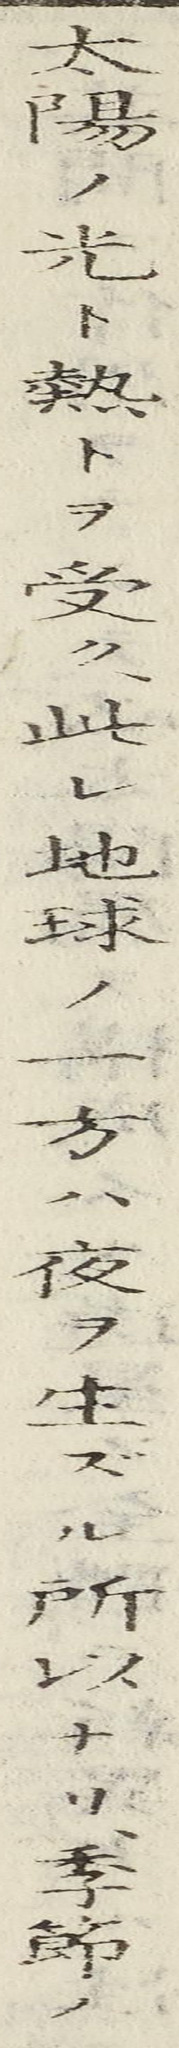太陽ノ光ト熱トヲ受ク、此レ地球ノ一方ハ夜ヲ生ズル所以ナリ、季節ノ
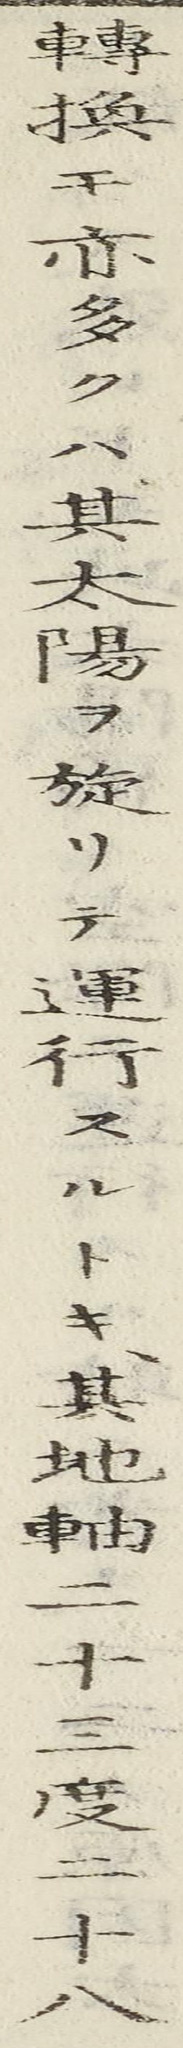転換モ亦多クハ其太陽ヲ旋リテ運行スルトキ、其地軸二十三度二十八
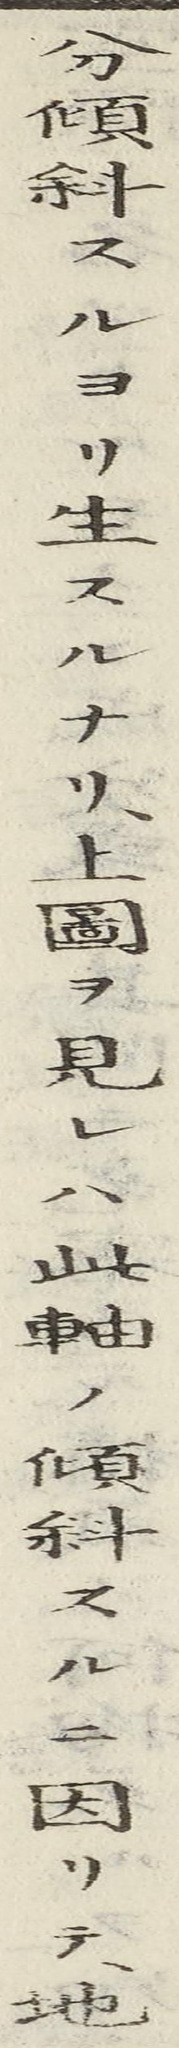分傾斜スルヨリ生スルナリ、上図ヲ見レハ此軸ノ傾斜スルニ因リテ、地
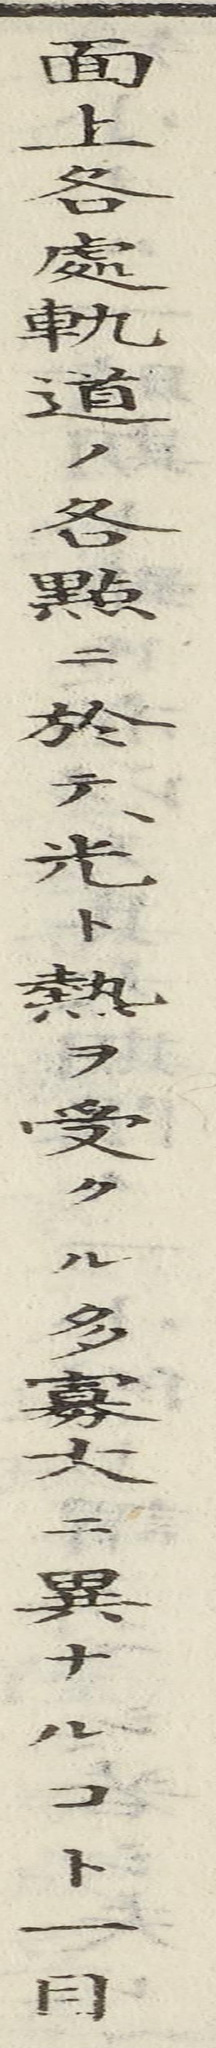面上各処軌道ノ各点ニ於テ、光ト熱ヲ受クル多寡大ニ異ナルコト一目
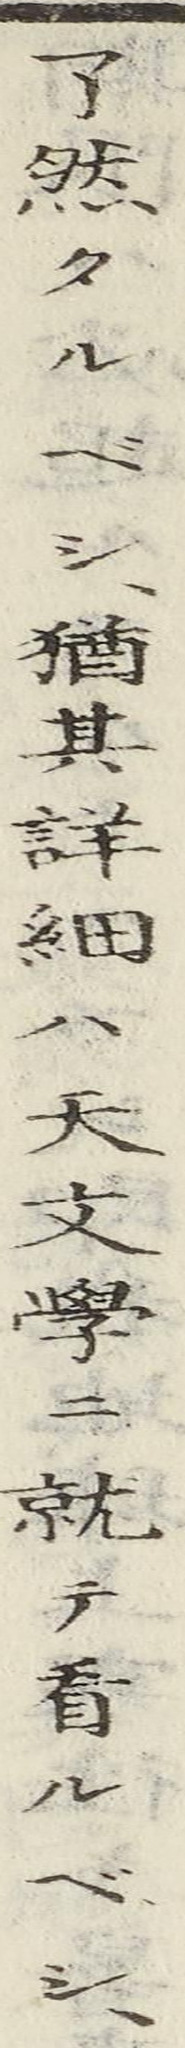了然タルベシ、猶其詳細ハ天文学ニ就テ看ルベシ、
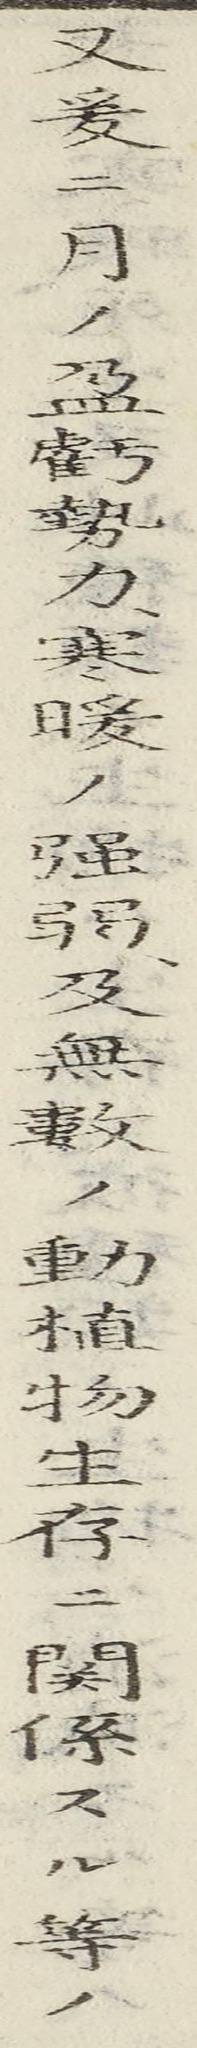又爰ニ月ノ盈虧勢力、寒暖ノ強弱、及無数ノ動植物生存ニ関係スル等ノ
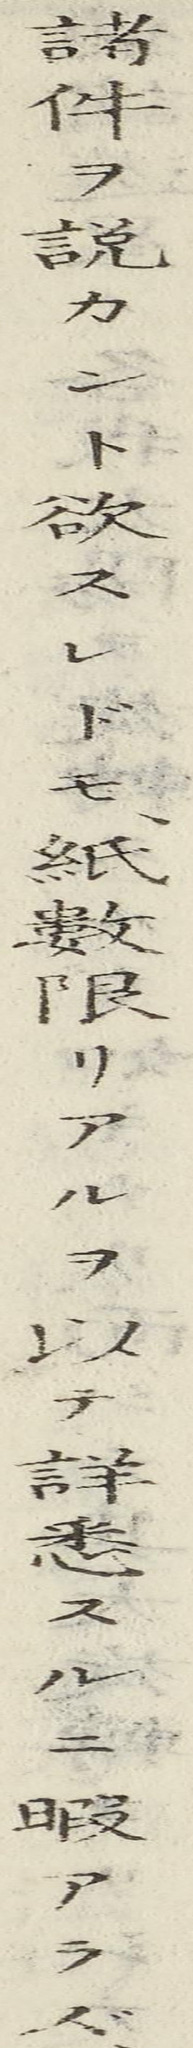諸件ヲ説カント欲スレドモ、紙数限リアルヲ以テ詳悉スルニ暇アラズ、
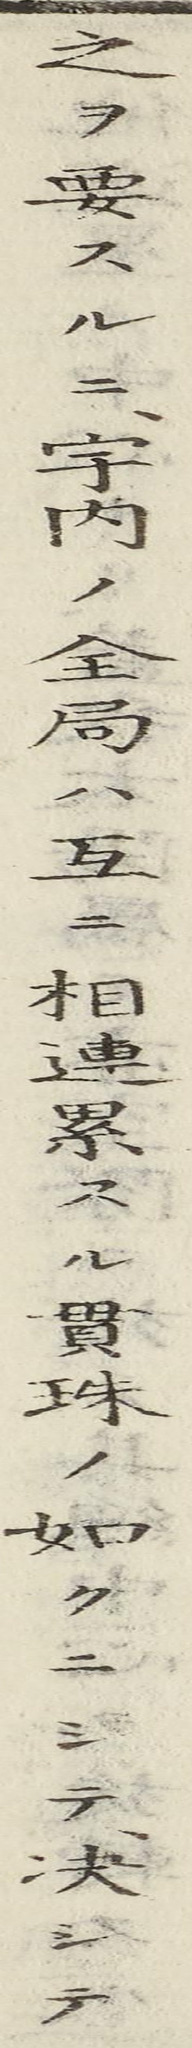之ヲ要スルニ、宇内ノ全局ハ互ニ相連累スル貫珠ノ如クニシテ、決シテ
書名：百科全書　地文學　全
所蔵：東京大学地震研究所図書室 Earthquake Research Institute Library, The University of Tokyo, JAPAN
